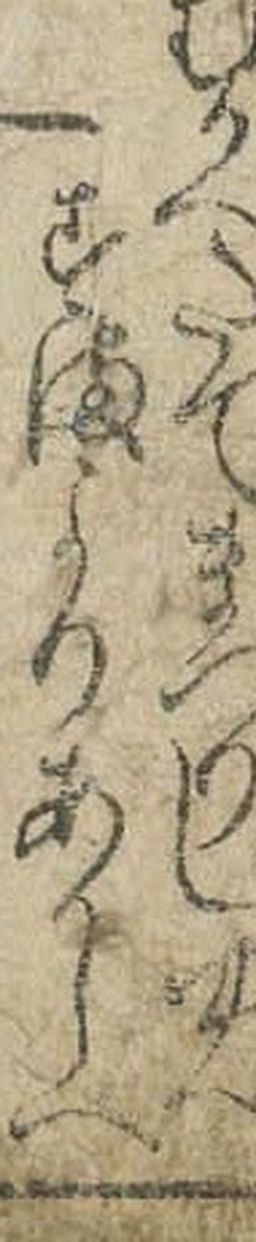すまよりあかしへ
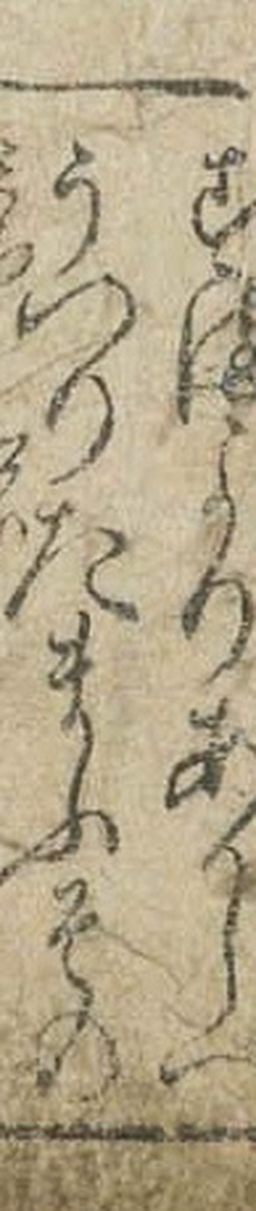うつりたまふその
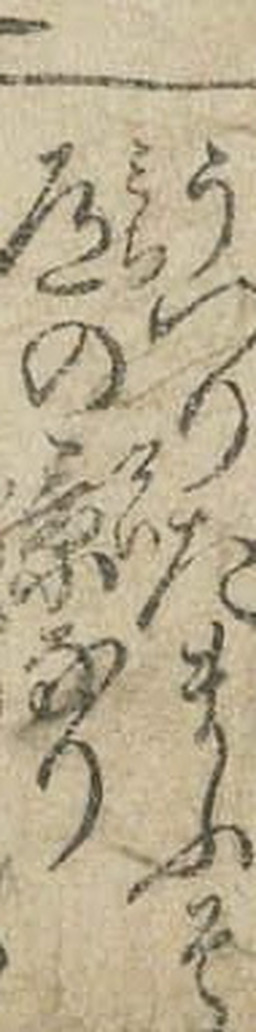道の景なり
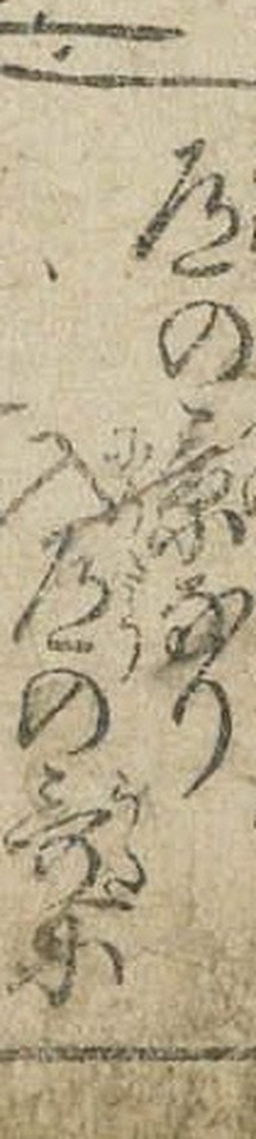入道の哥に
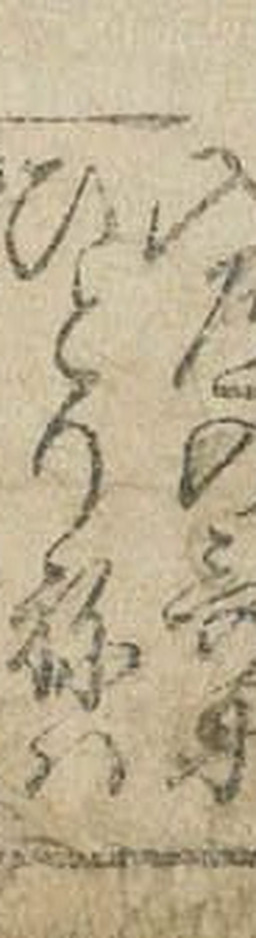ひとりねは
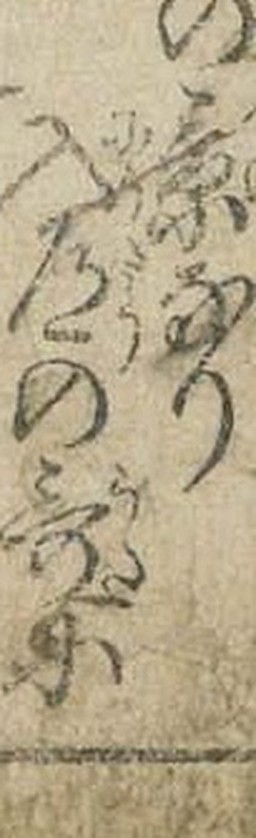入道の哥に
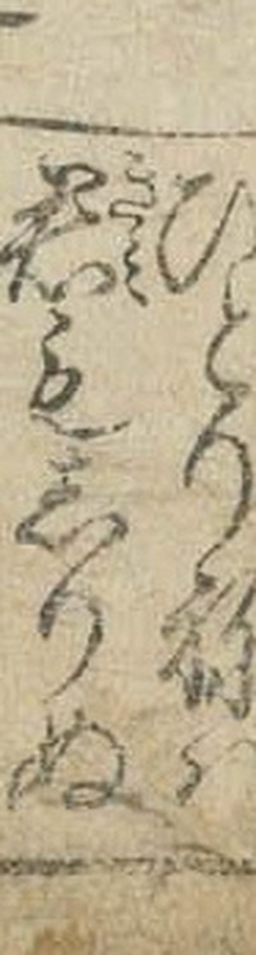君もしりぬ
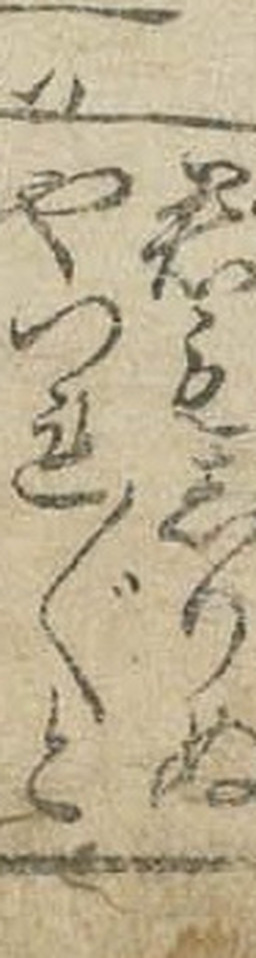やつれ〴〵と
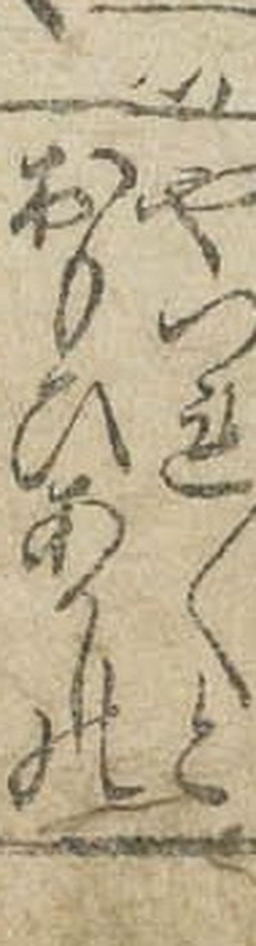おもひあかしの
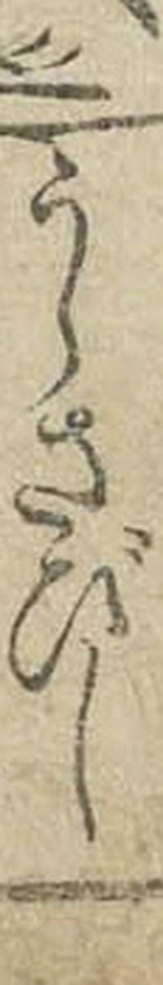うらさびし
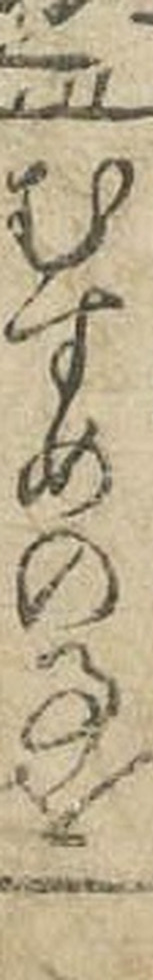むすめの事を
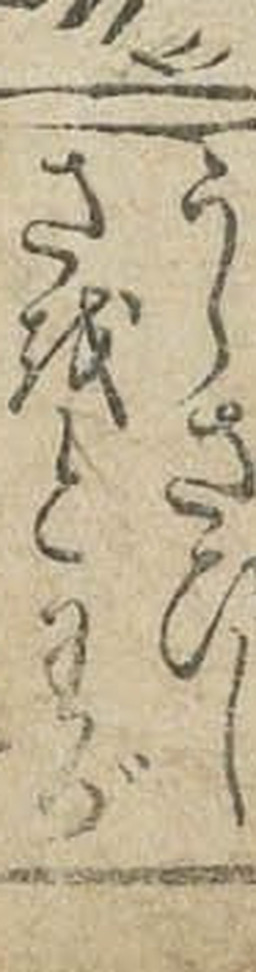さをとわが
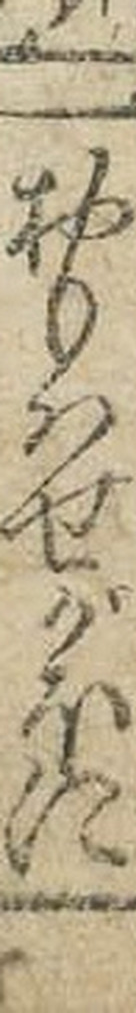おもはせがほに
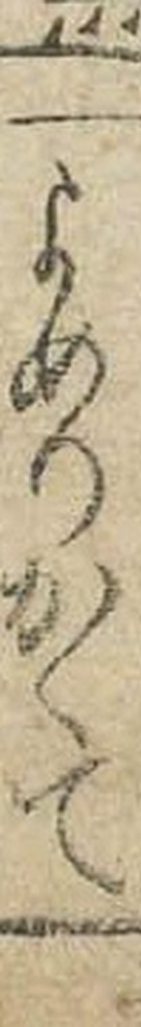よめりかくて
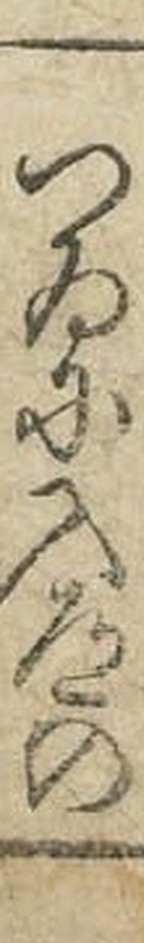つゐに入道の
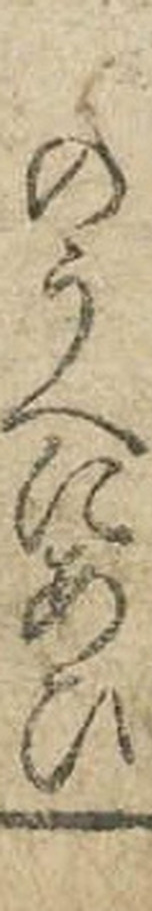のうへにあひ
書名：絵本写宝袋 9巻 1之巻
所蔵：東京学芸大学教育コンテンツアーカイブ
